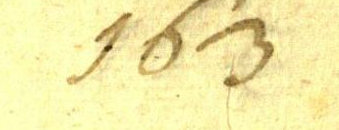163
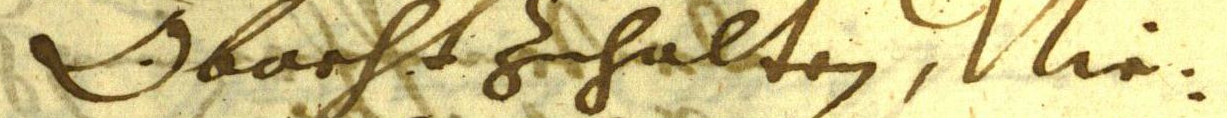Obacht Zūhalten, Nie¬
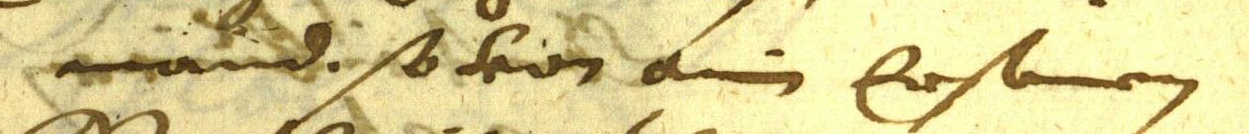mand. so von aim Ersamen
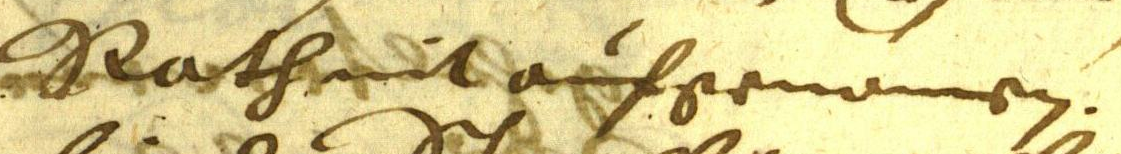Rath nit aūfgenomen.
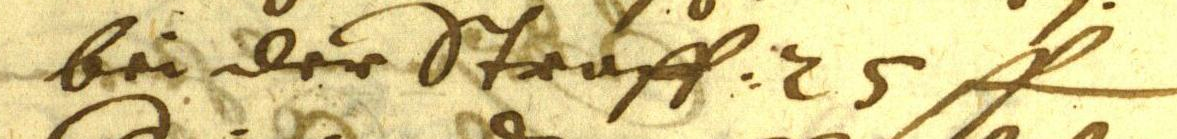bei der Straff: 25 fl
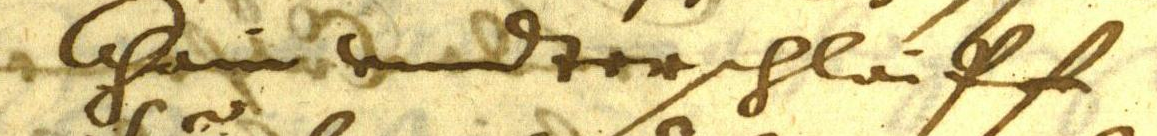khain vnndterschlaipf
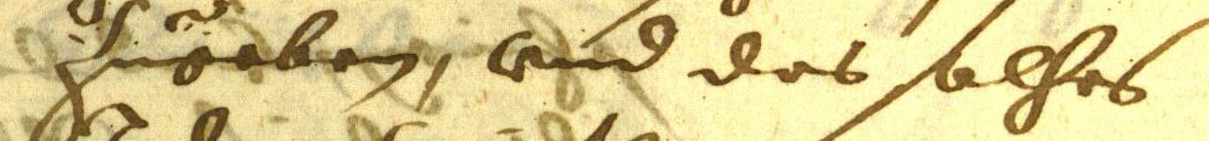Zūgeben, vnd das solhes
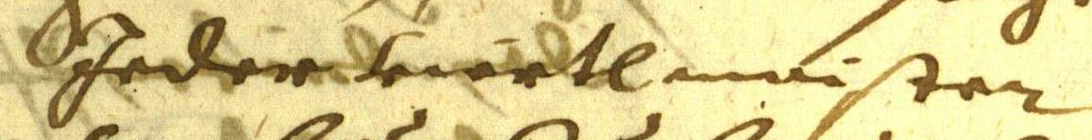Jeder viertlmaister
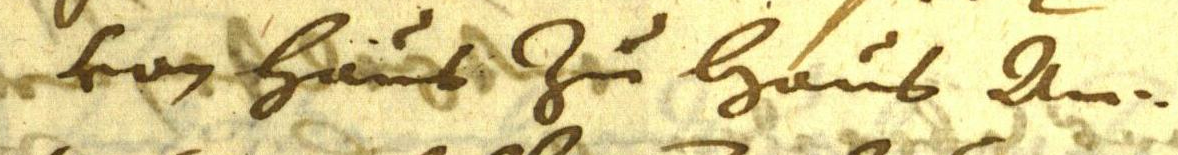von Haūs Zū Haūs An¬
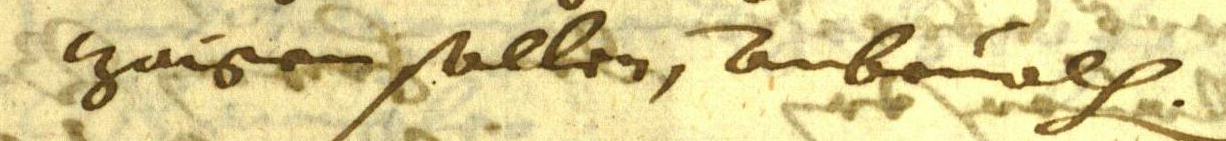zaigen sollen, Anbeūolh.
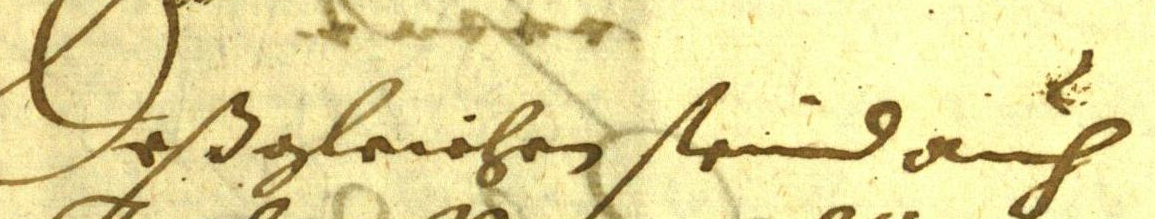Deßgleichen seind aūch
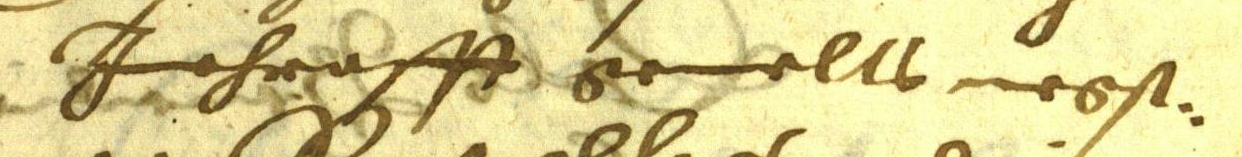Inchrafft gemelts negst¬
